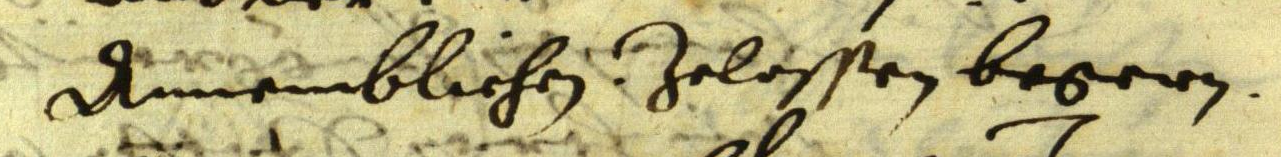Annemblichen. Zelassen begern.
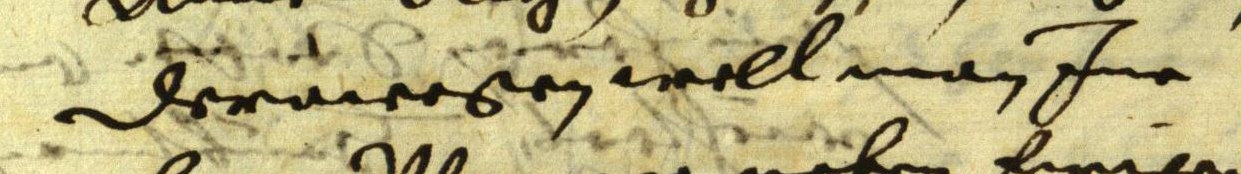derowegen well man Ime
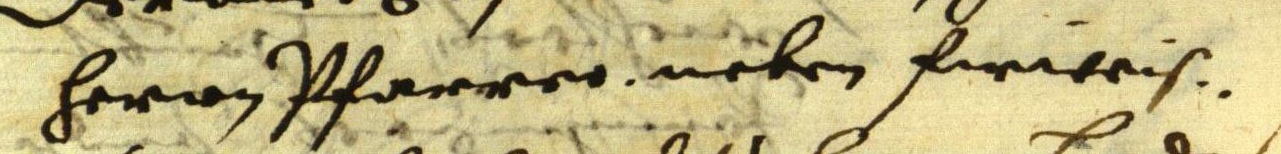herrn Pfarrer. neben firweis¬
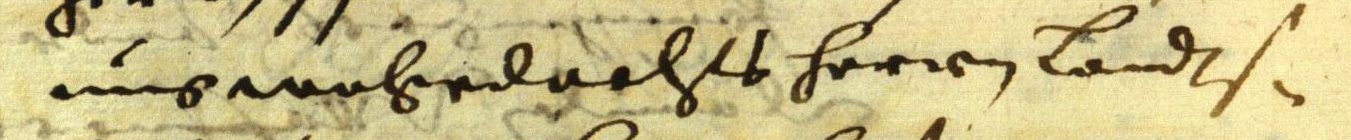ūng wolgedachts herrn Landts¬
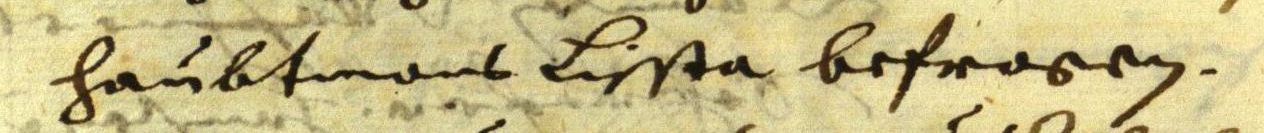haūbtmans Lissta befragen.
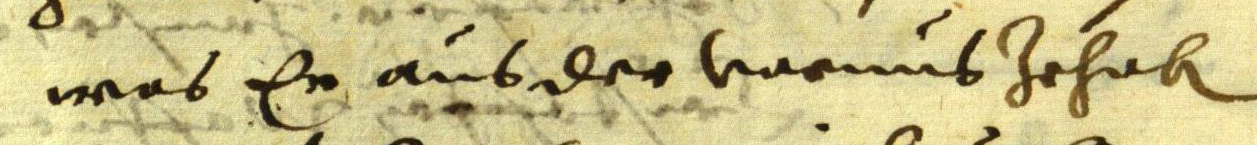was Er aūs der vormūg Zehab
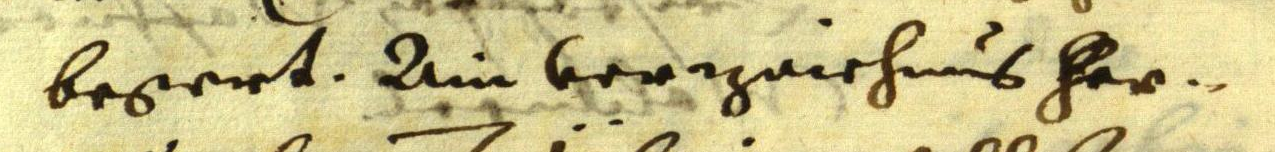begert. Ain verzaichnūng her¬
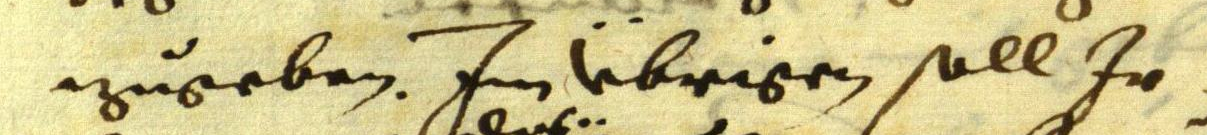zūgeben. Im v̈brigen soll Ir
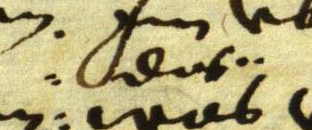:das:
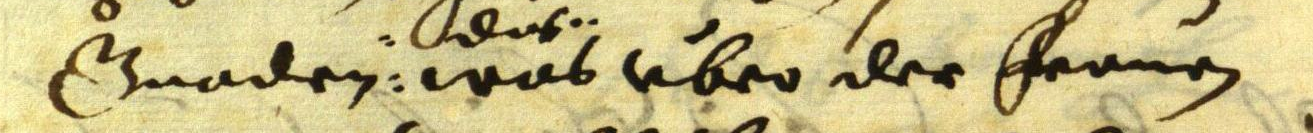Gnaden: was v̄ber der Fraūen
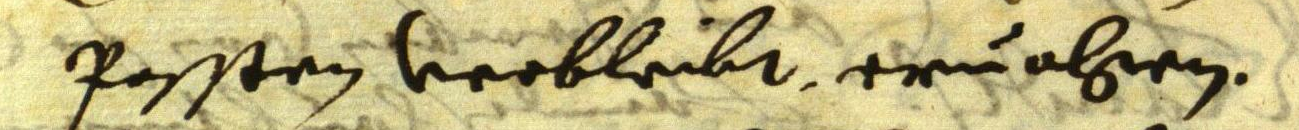Possten verbleibt. erūolgen.
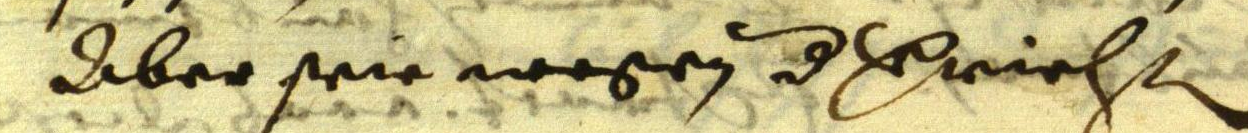Aber seie wegen d vricht
